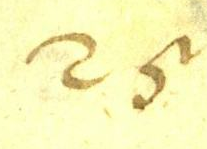25
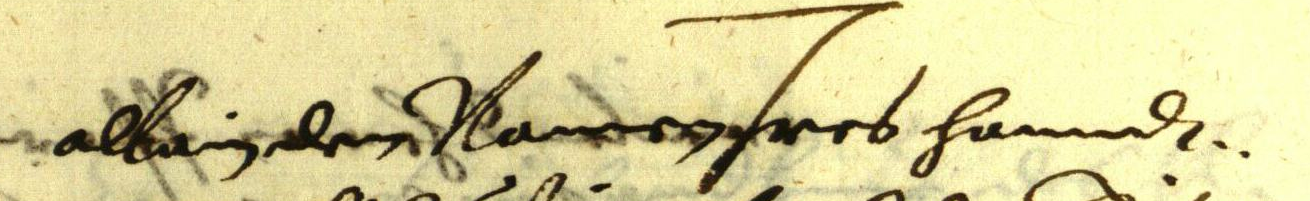allain den Namen Ires hanndt¬
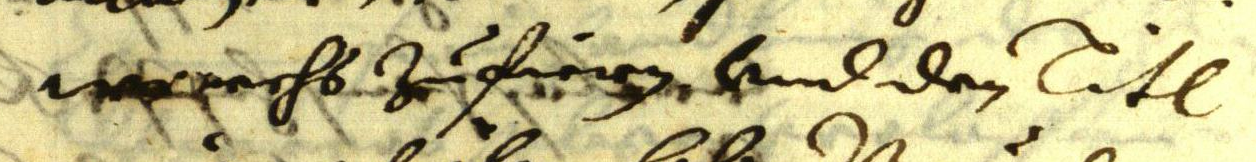werchs Zū fiern vnd den Titl
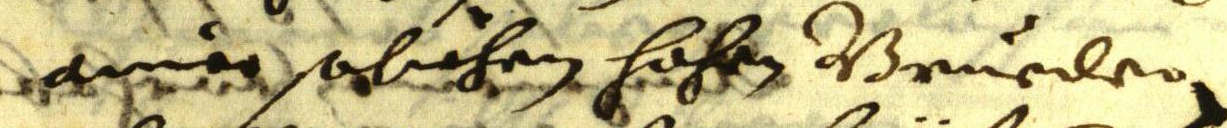ainer solichen hohen Brūeder¬
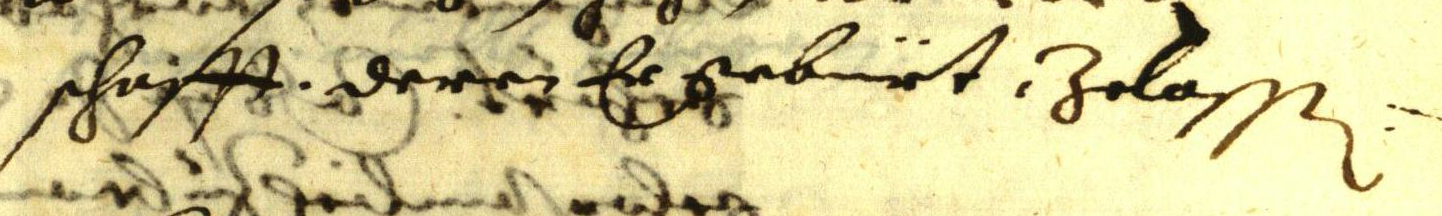schafft. deren Er gebürt, Zelassen.
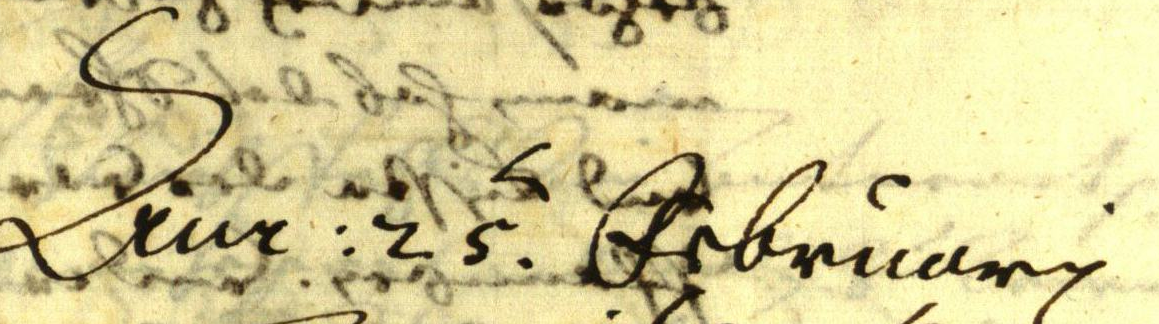Am: 25. Febrūarj
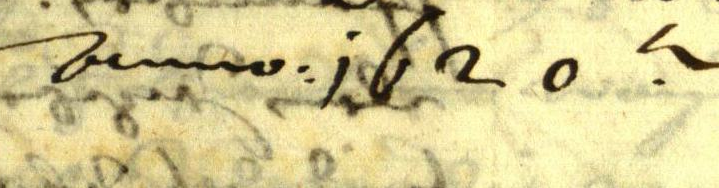Anno: 1620 t.
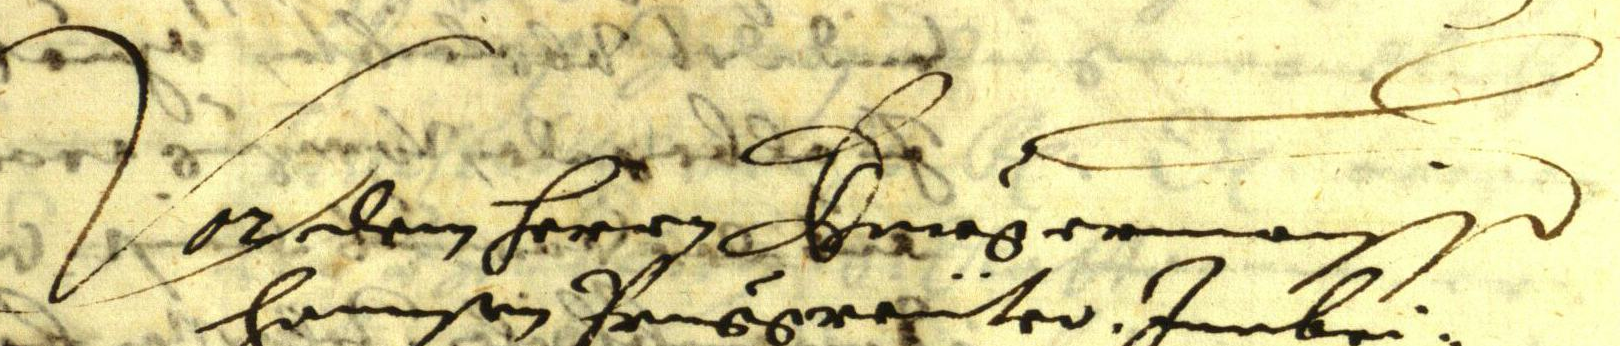Vor dem herrn Būrgermaisst
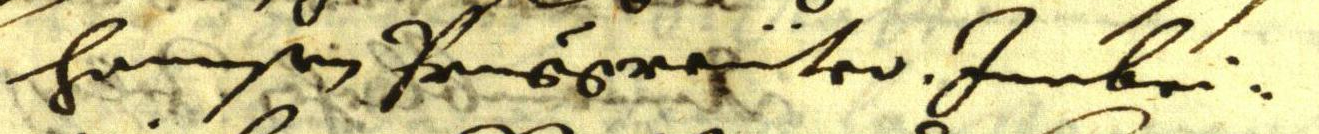Hannsen Prūggreüter. Innbei¬
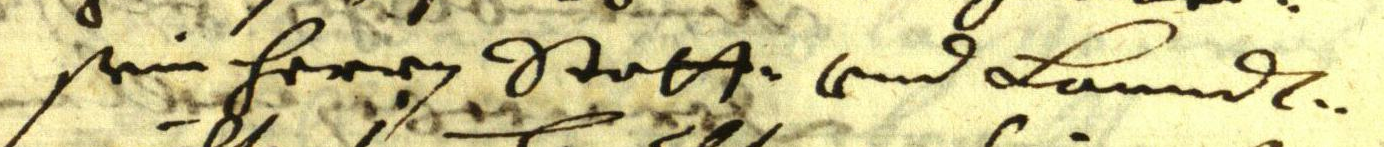sein herrn Statt: vnd Lanndt¬
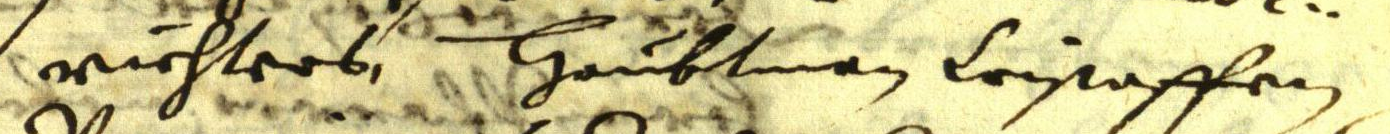richters, Haūbtman Cristoffen
